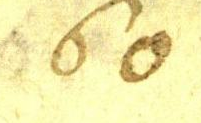60
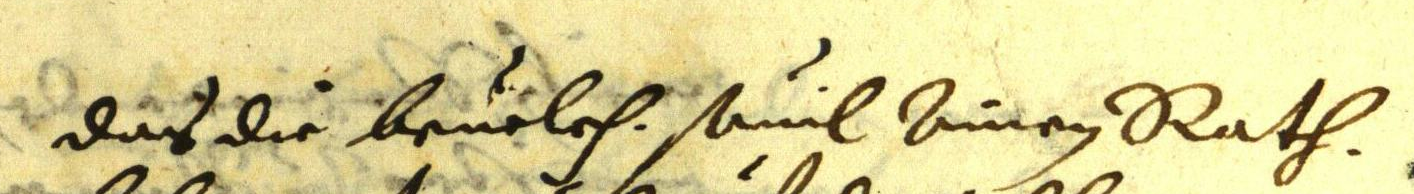das die beūelch. soūil Ainen Rath.
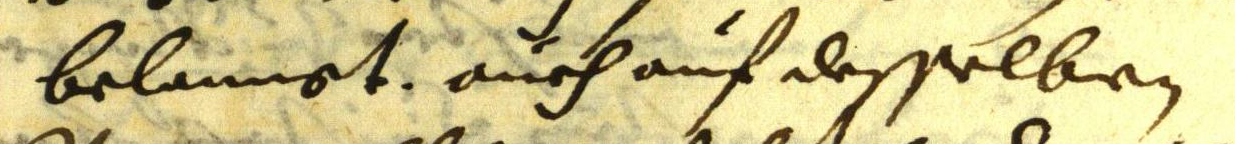belanngt. aūch aūf desselben
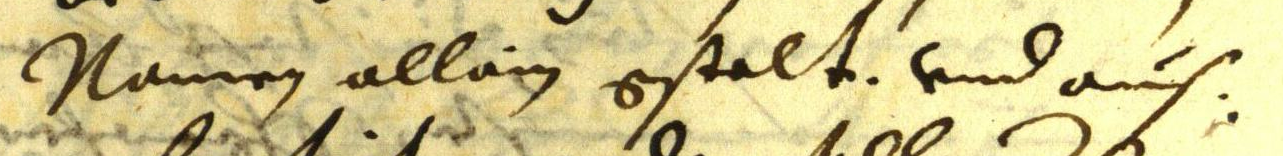Namen allain gestelt. vnd aūs¬
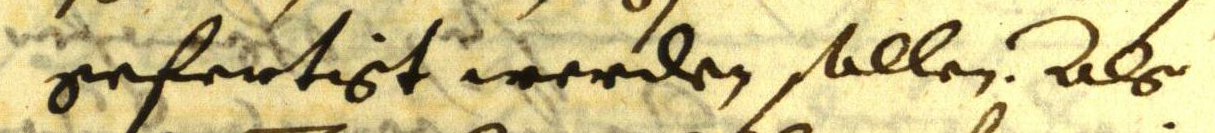gefertigt werden sollen. Als
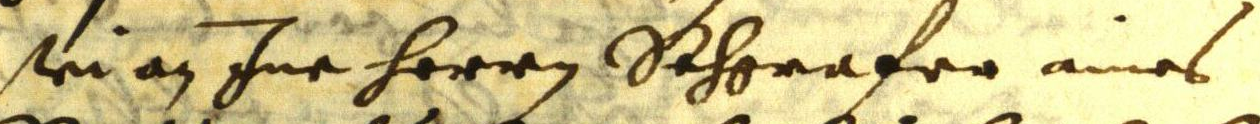sei an Ine herrn Schgrafer aines
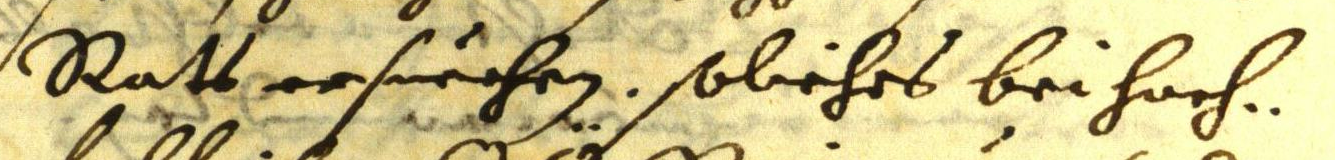Rats ersūechen. soliches bei hoch¬
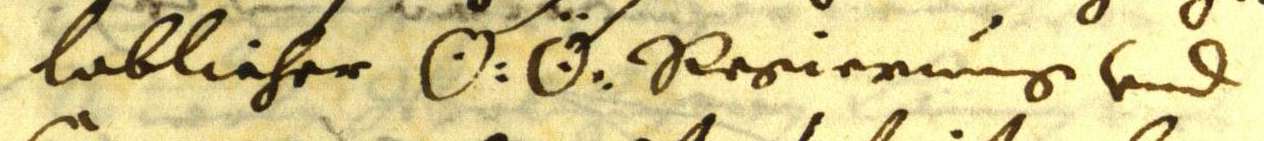loblicher O: Ö: Regierūng vnd
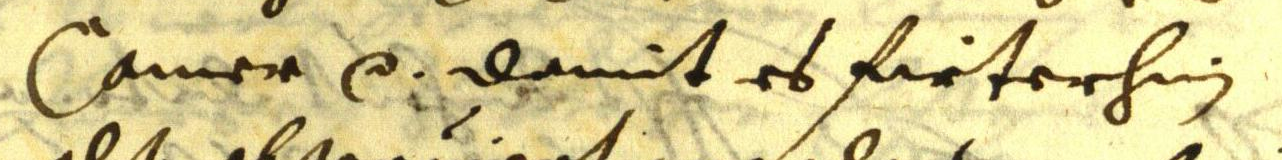Camer etc. damit es firterhin
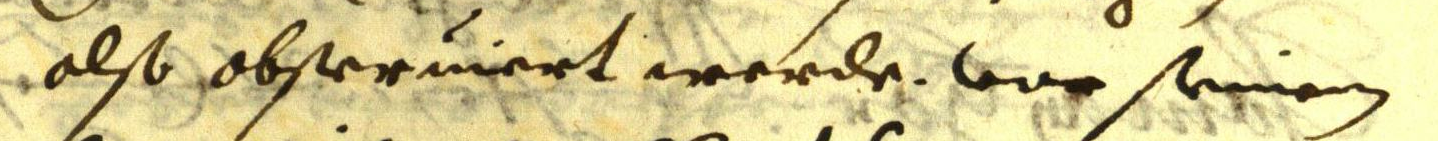also obserūiert werde. vor seinem
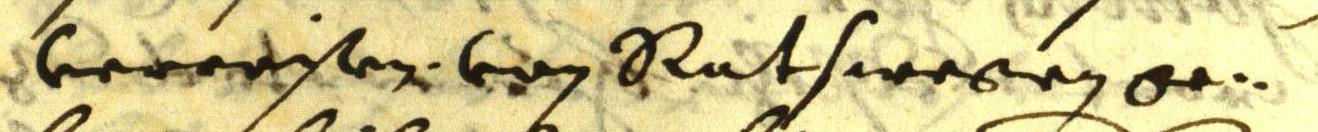verreisen. von Ratswegen ge¬
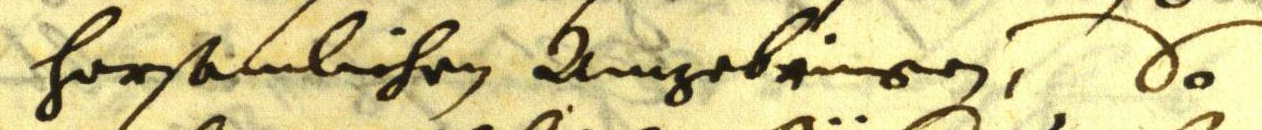horsamblichen Anzebringen, So
